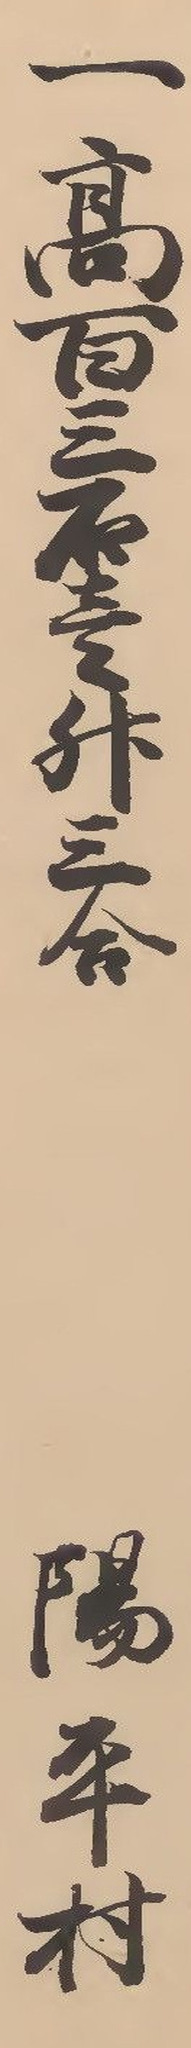一高百三石壱升三合陽平村
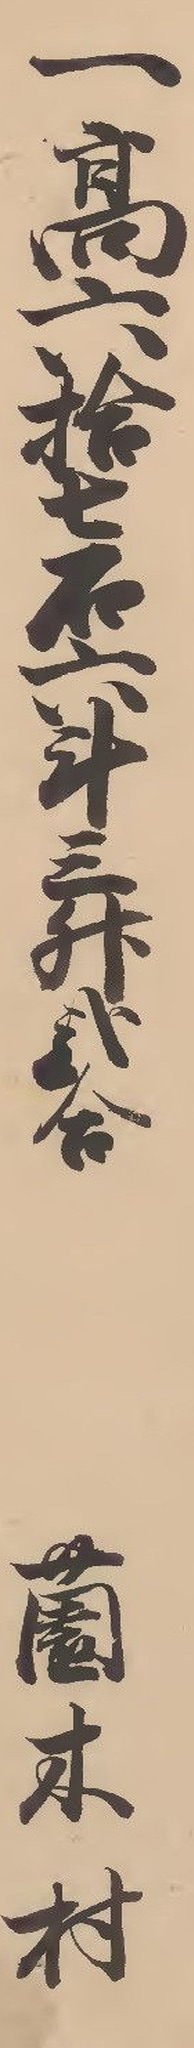一高六拾七石六斗三升弐合園木村

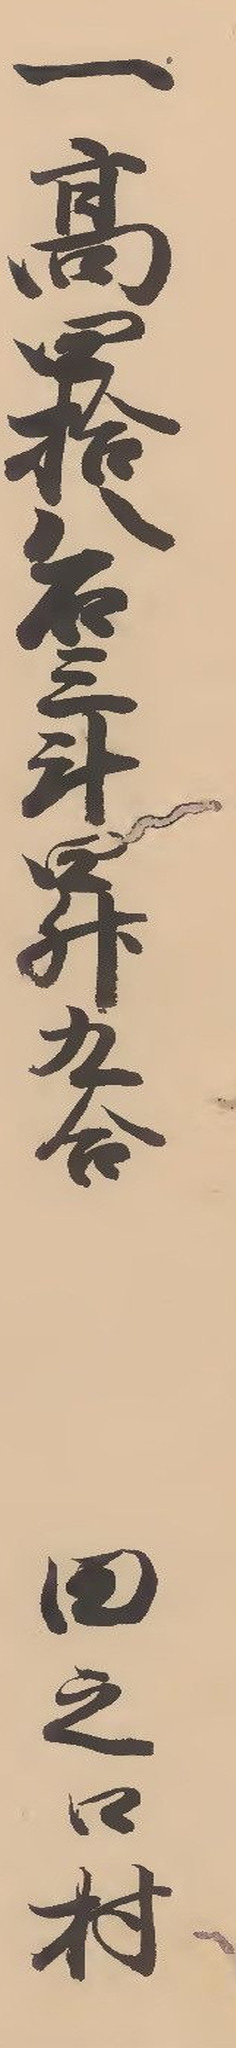一高四拾八石三斗四升九合田之口村
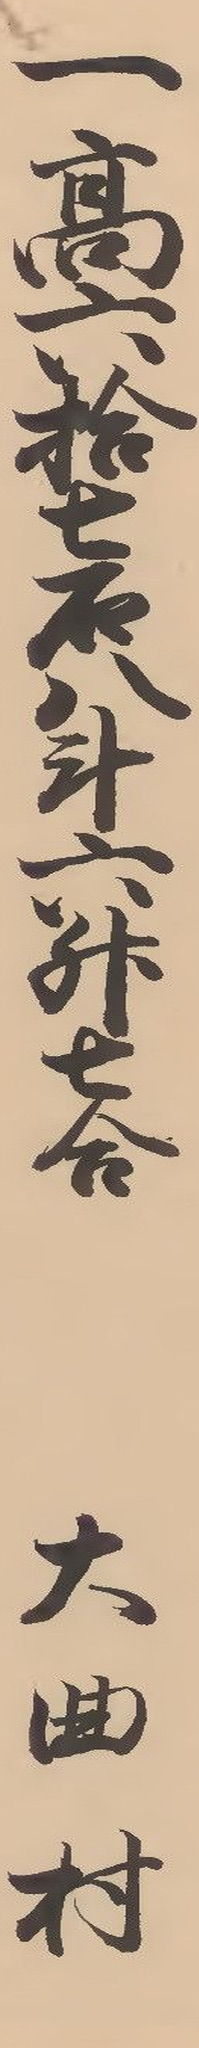一高六拾七石八斗六升七合大曲村
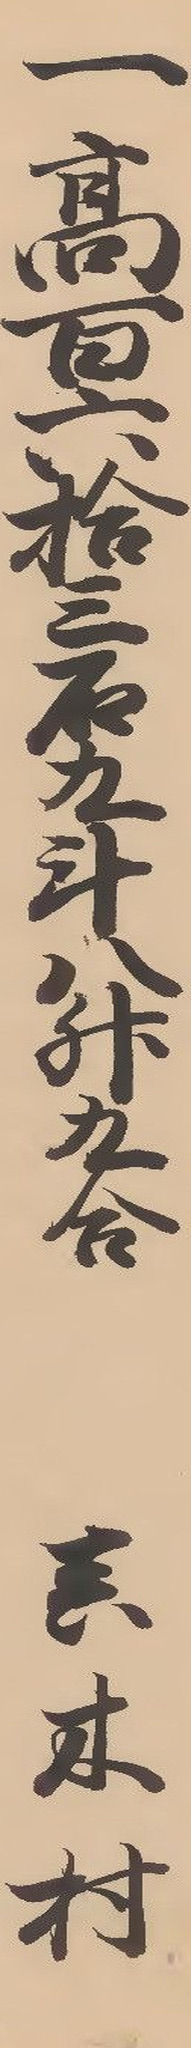一高百六拾三石九斗八升九合真木村
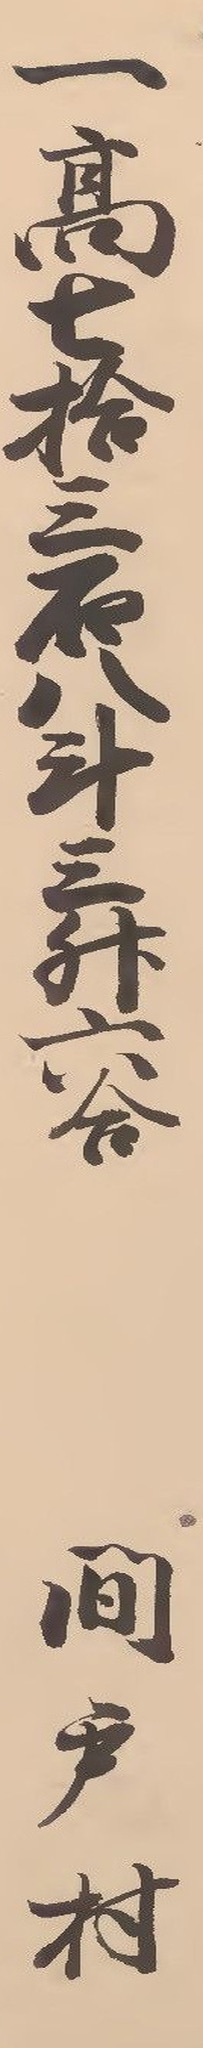一高七拾三石八斗三升六合間戸村
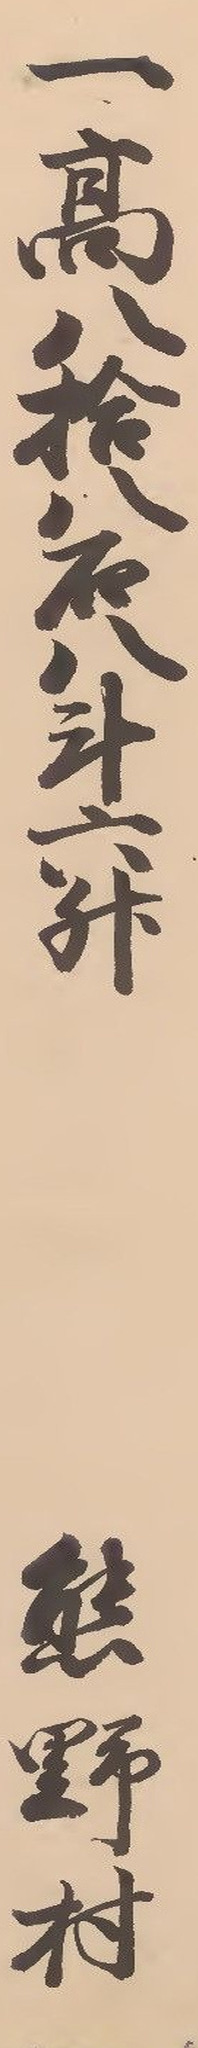一高八拾八石八斗六升熊野村
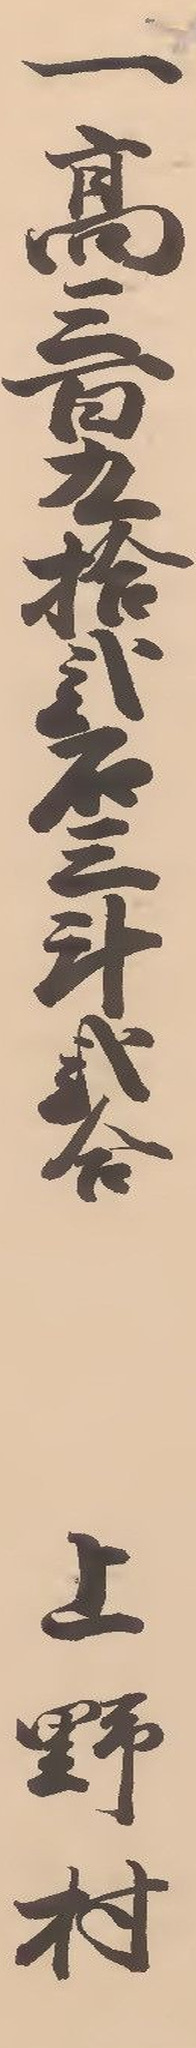一高三百九拾弐石三斗弐合上野村
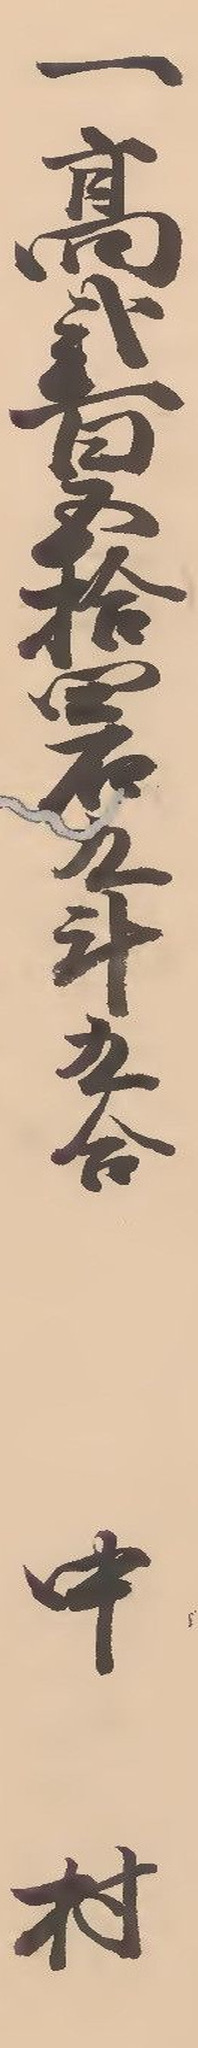一高弐百五拾四石九斗九合中村

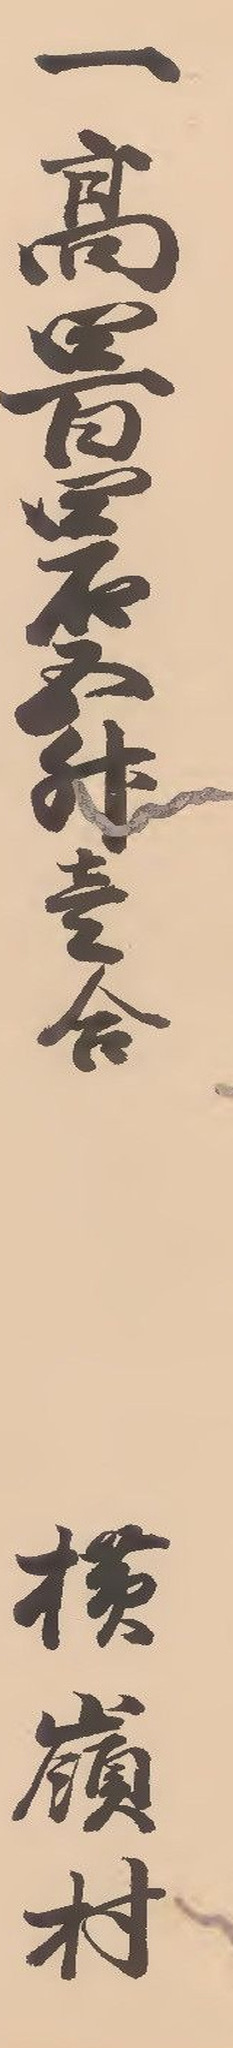一高四百四石五升壱合横嶺村
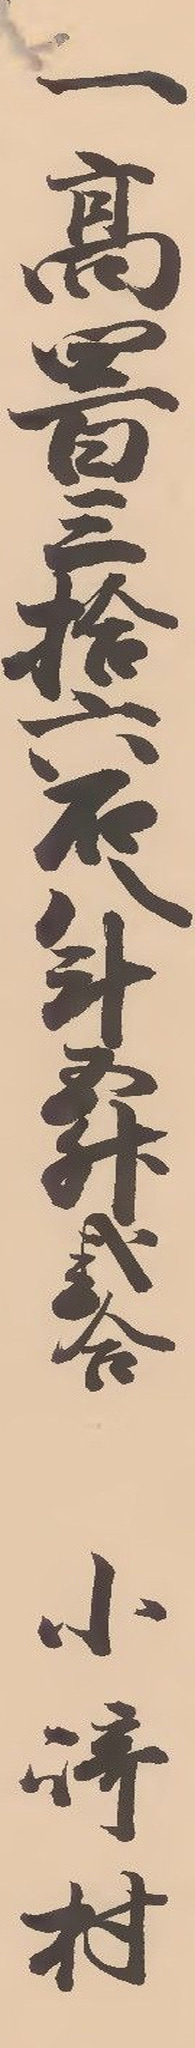一高四百三拾六石八斗五升弐合小崎村
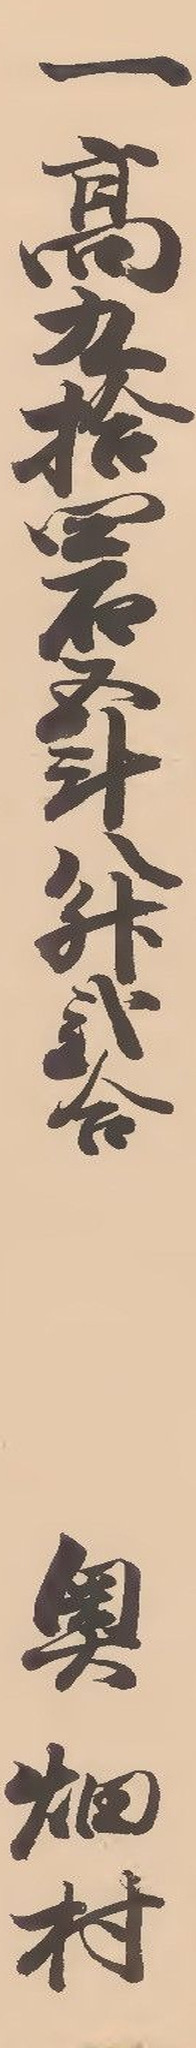一高九拾四石五斗八升弐合奥畑村
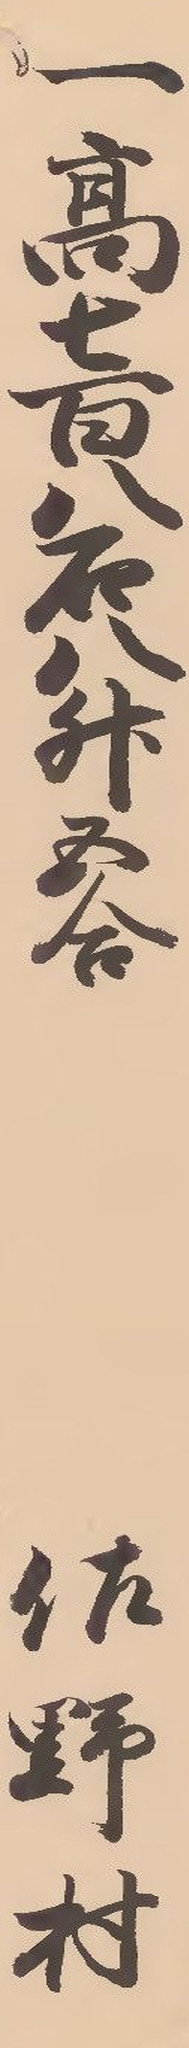一高七百八石八升五合佐野村
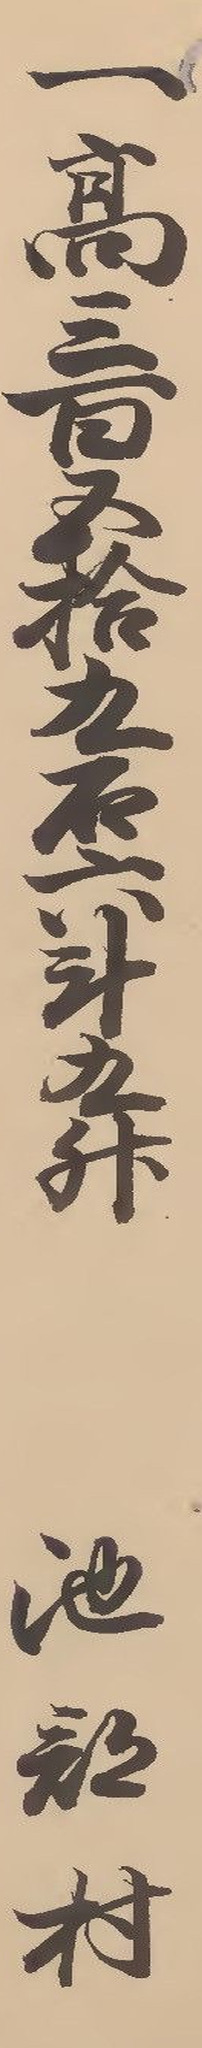一高三百五拾九石六斗九升池部村
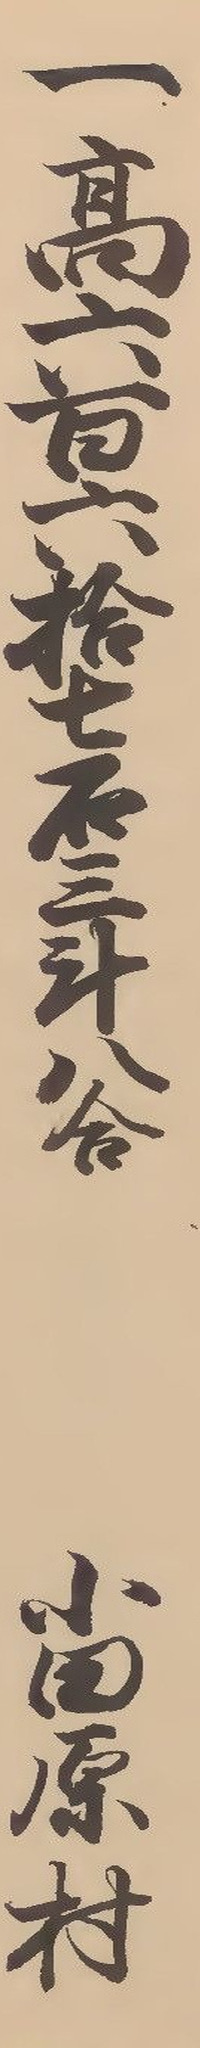一高六百六拾七石三斗八合小田原村
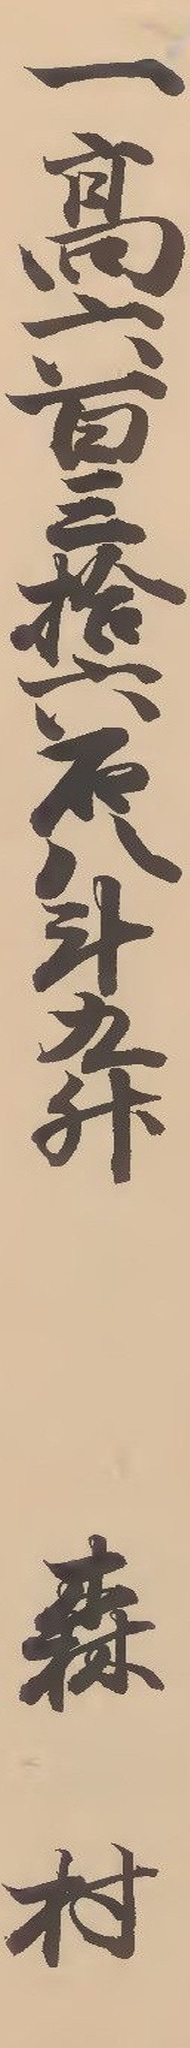一高六百三拾六石八斗九升森村
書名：豊後国郷帳
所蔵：国立公文書館 National Archives of Japan
